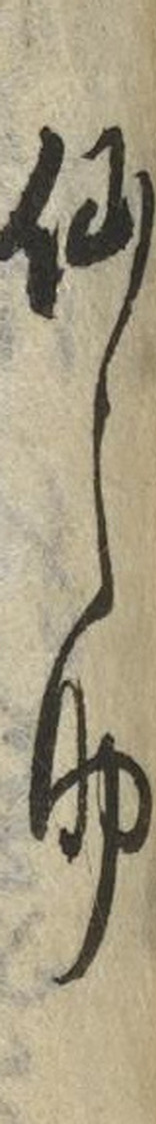仙之助
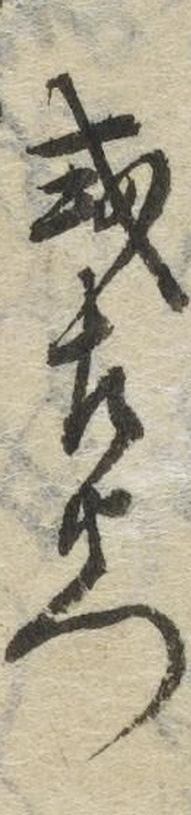式左衛門
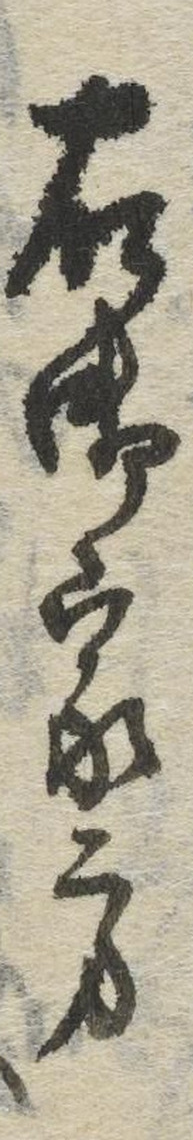右御家方
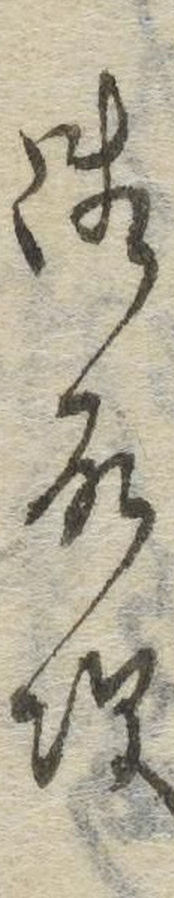御取次
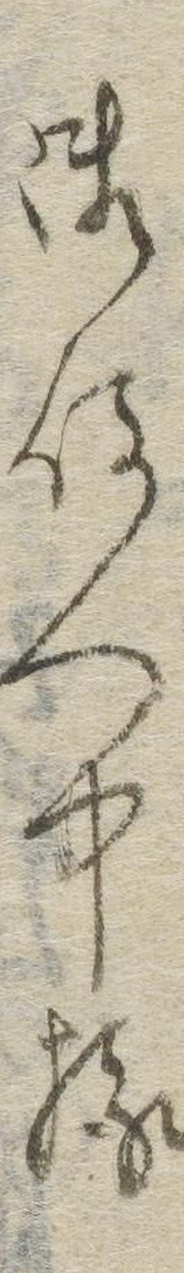御役人中様
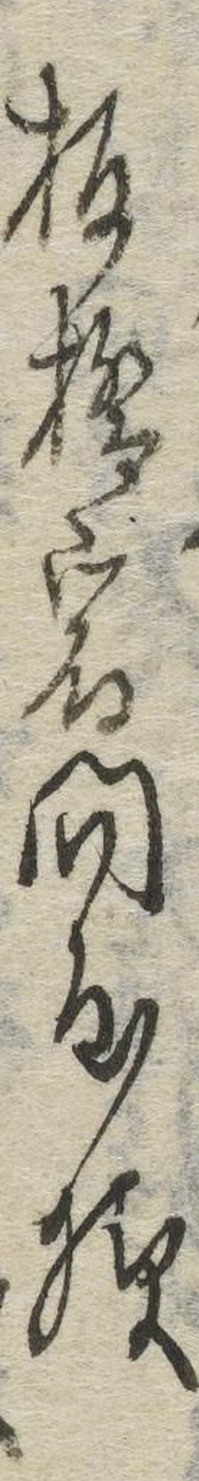板橋宿問屋様
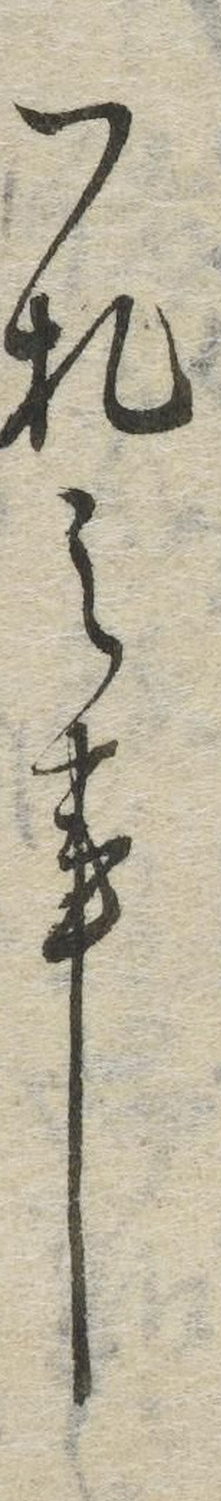一札之事
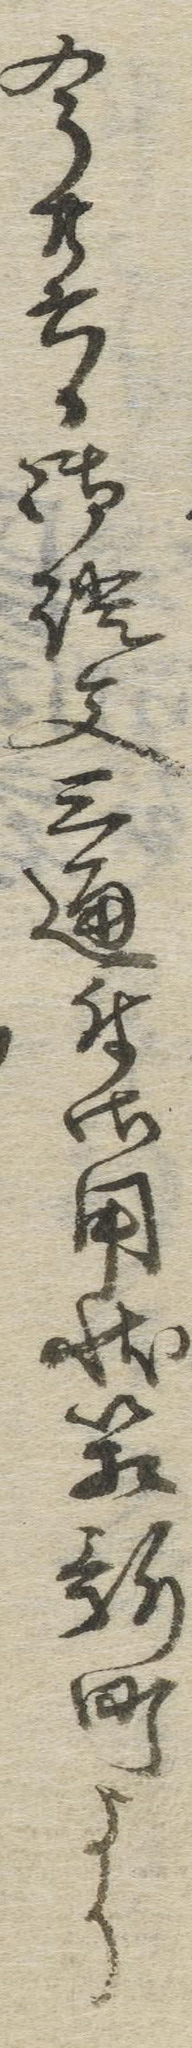右廿六日御證文三通付御用状箱新町より
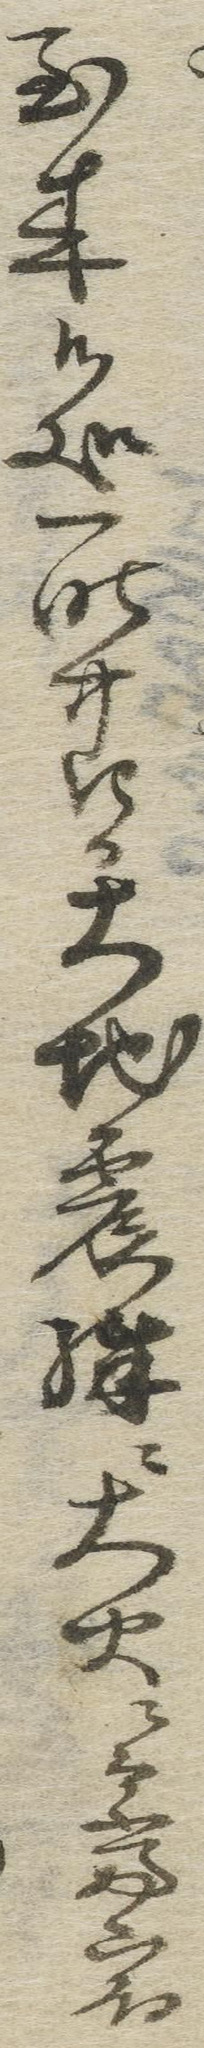到来候処一昨廿四日大地震殊二大火二而当宿
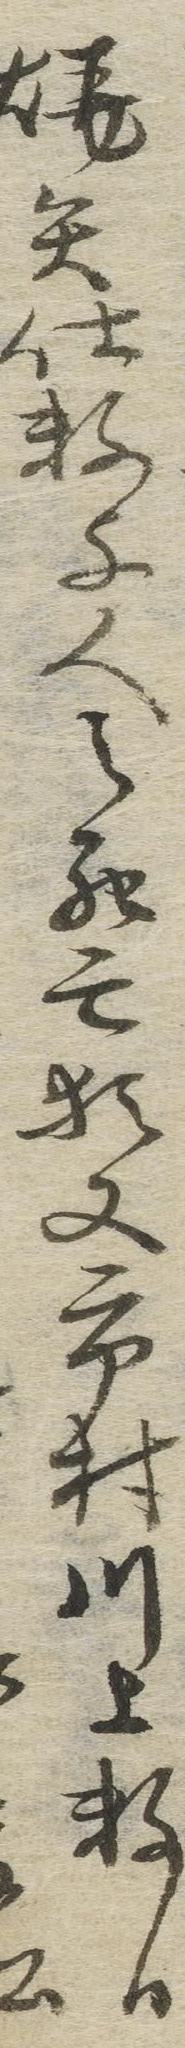焼失仕数千人之死亡猶又市村川上数日
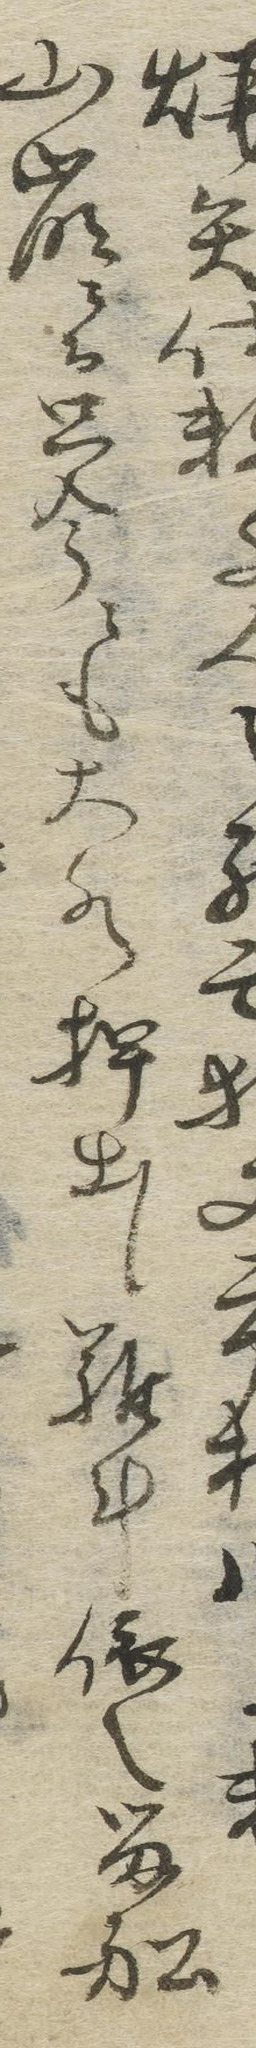山崩二而只今二も大水押出し難計依之留船
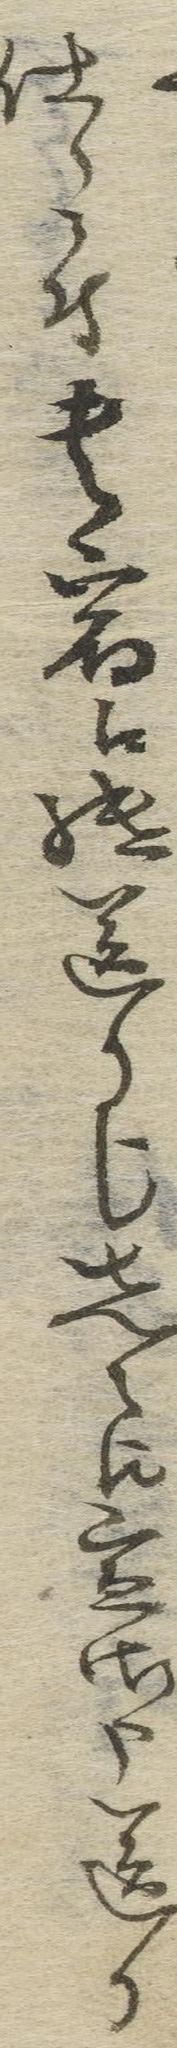仕候二付貴宿江継送り申候先々江宜御申送り

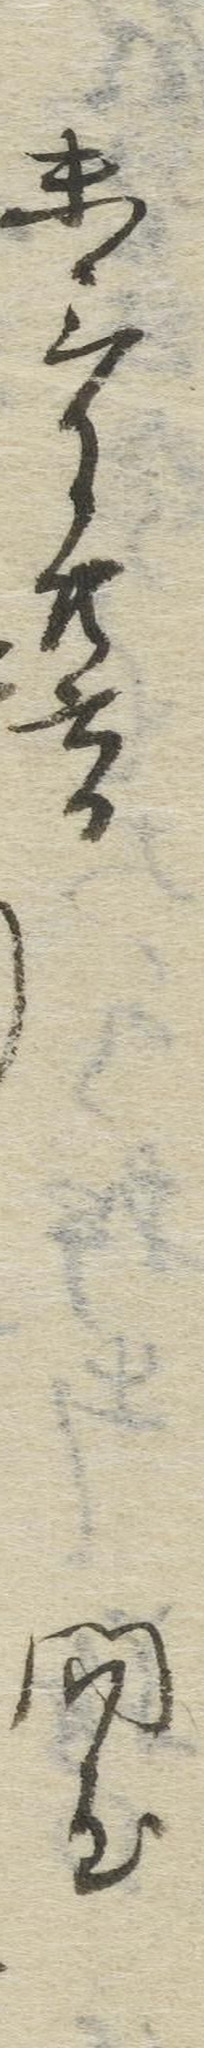未三月廿六日問屋
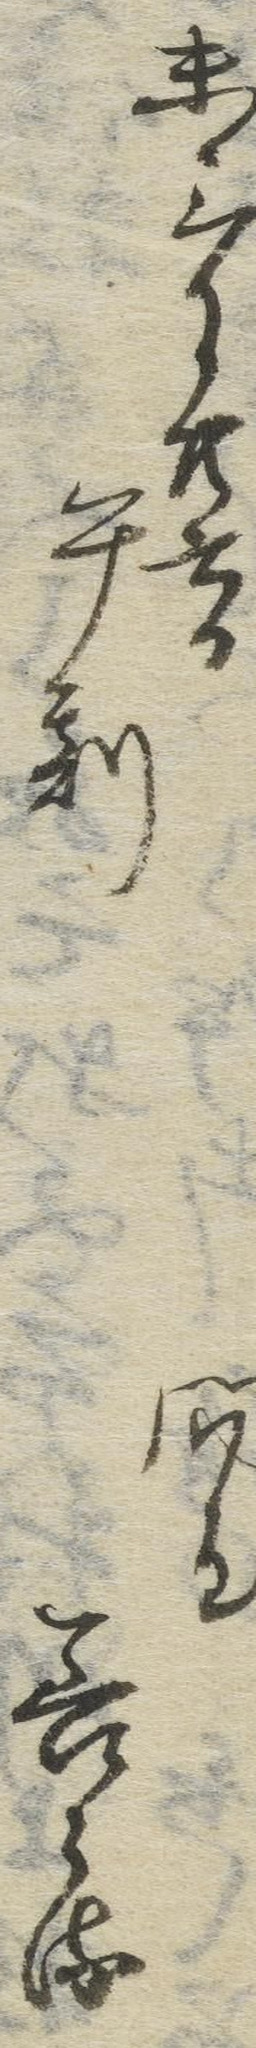午刻善兵衛
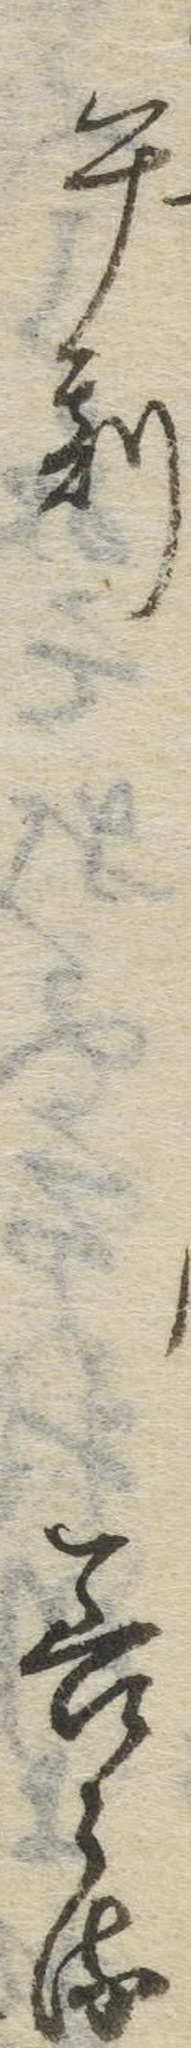午刻善兵衛
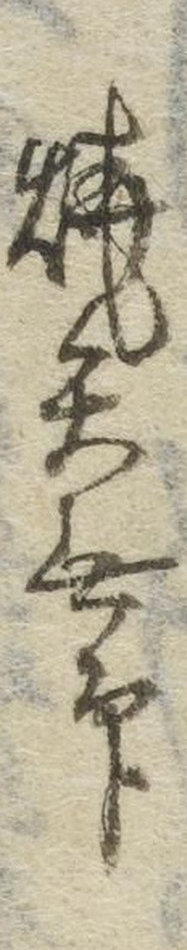焼失無印
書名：信濃越後　地震書留
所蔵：東京大学地震研究所図書室 Earthquake Research Institute Library, The University of Tokyo, JAPAN
